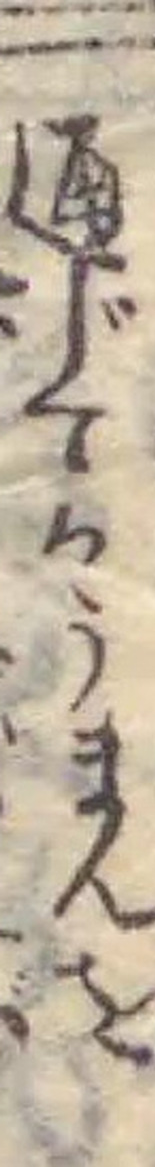通じてかうまんを
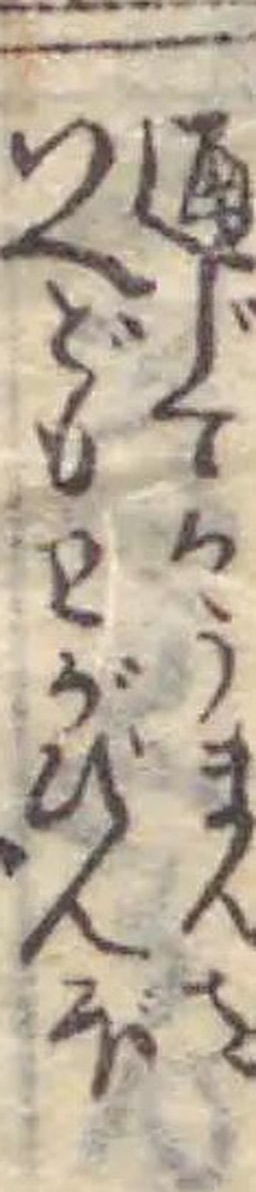いへどもわがびんぼ
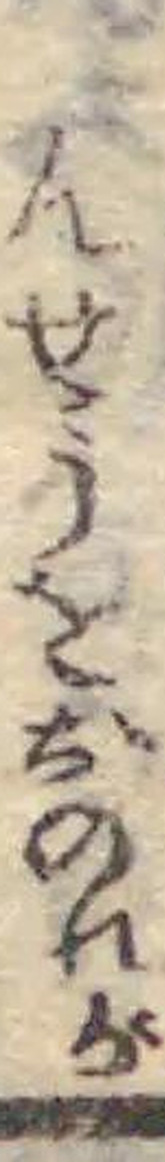んせうをのこれが
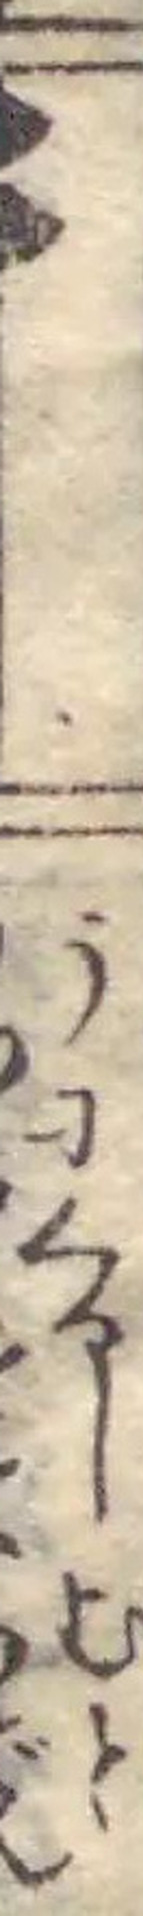うにくるしむ
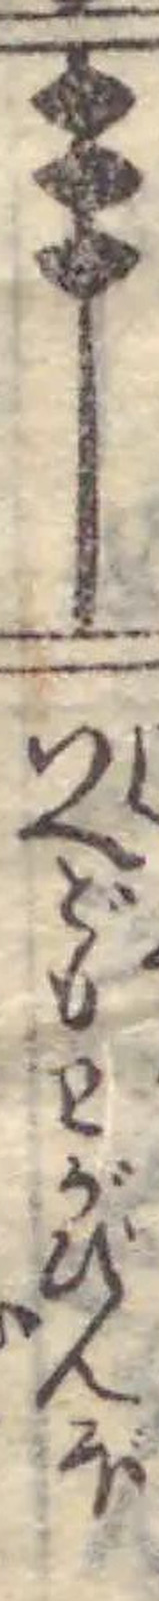いへどもわがびんぼ
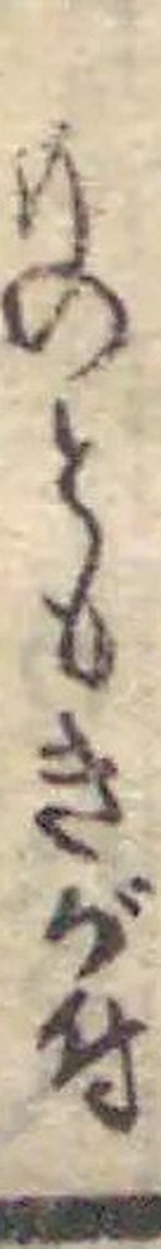ものともきが付
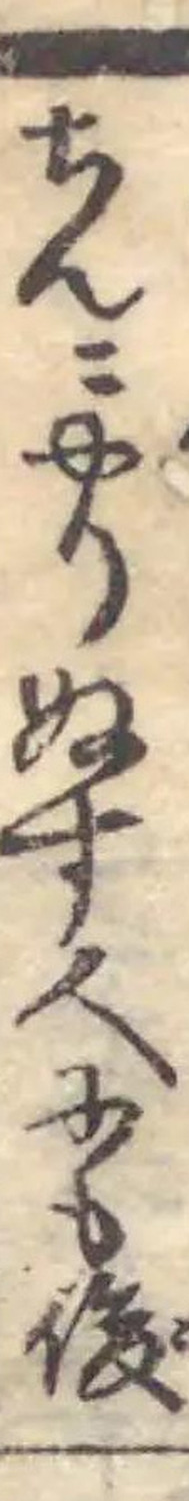ちんにやりぬす人にも後
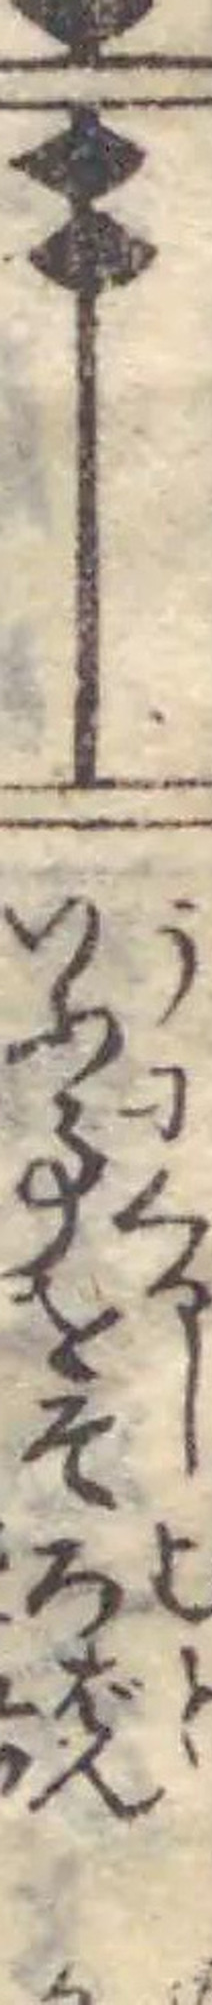といふ事をそろばん
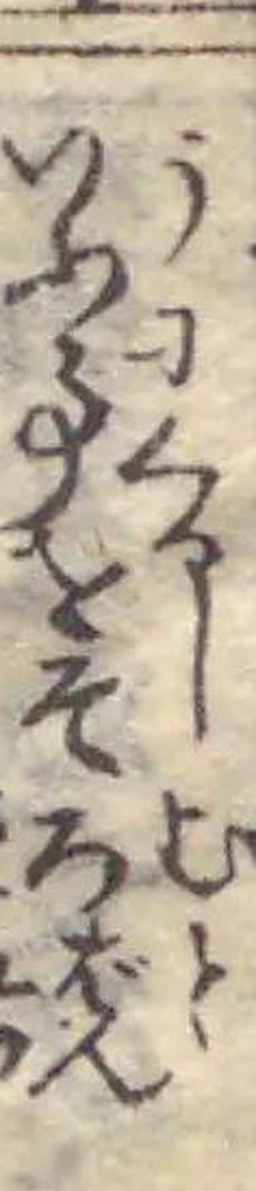といふ事をそろばん
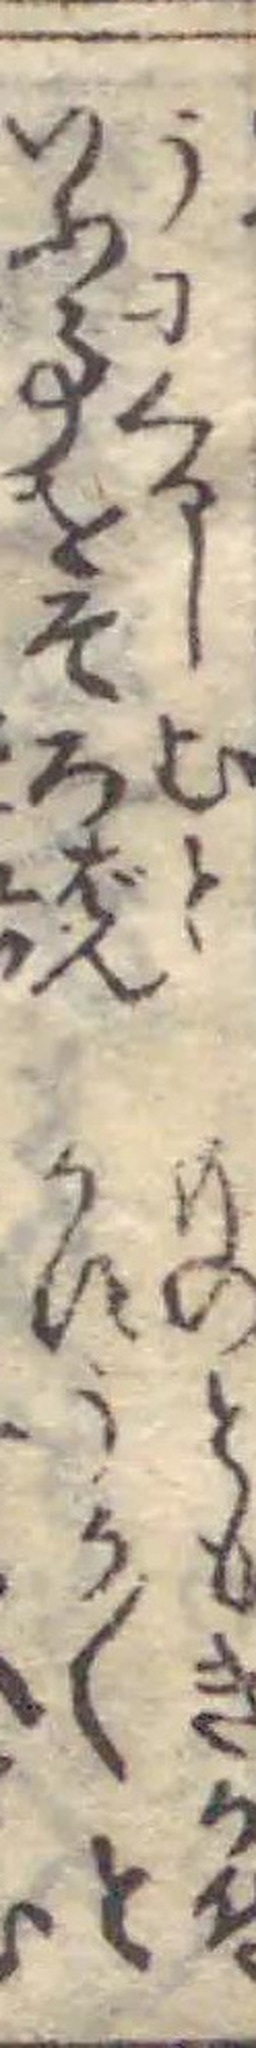といふ事をそろばん
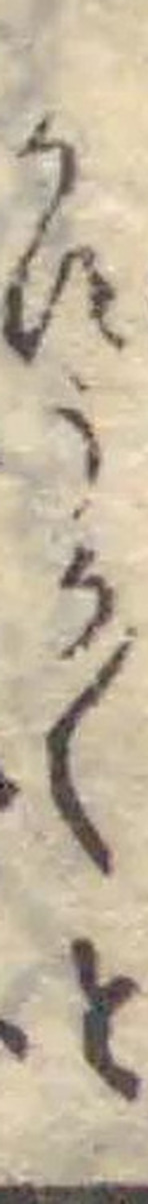かすうか〳〵と
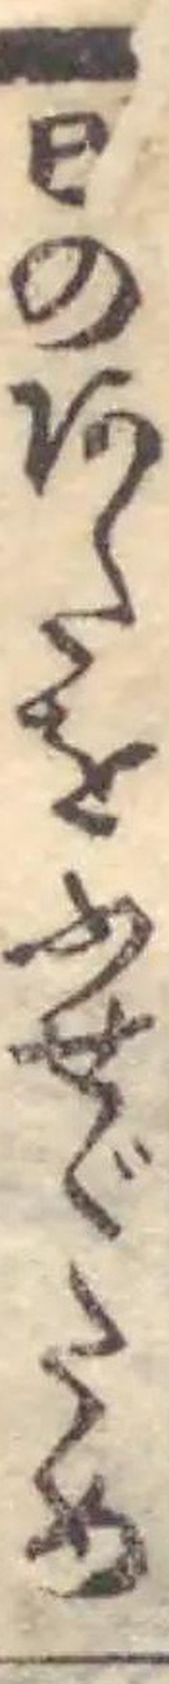日のあたをふせぐため
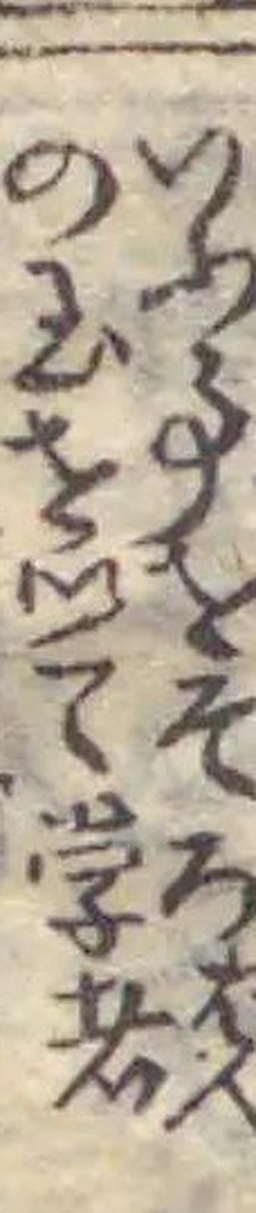の玉を以て学者
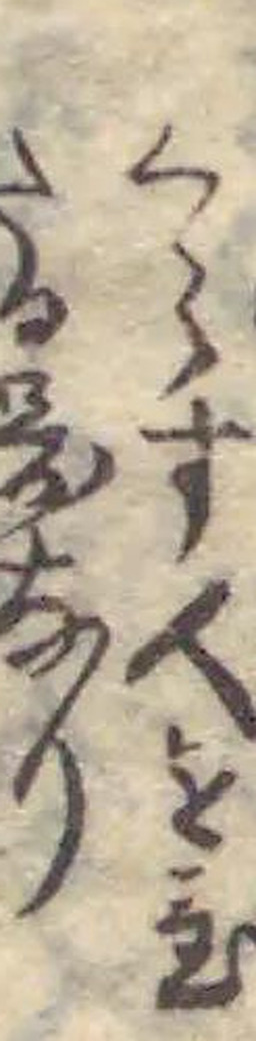たる図なり
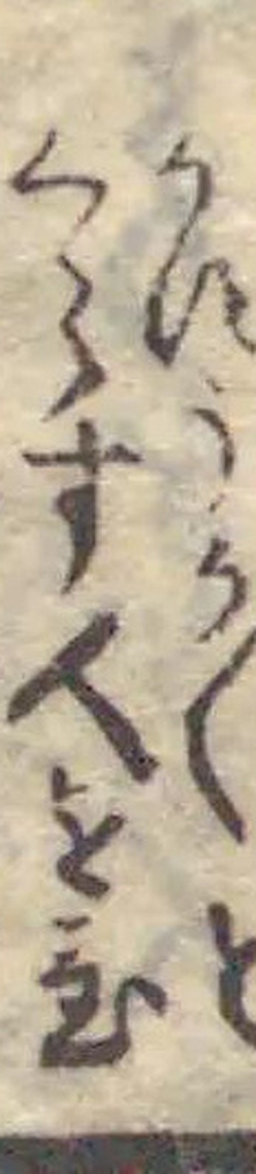くらす人を置
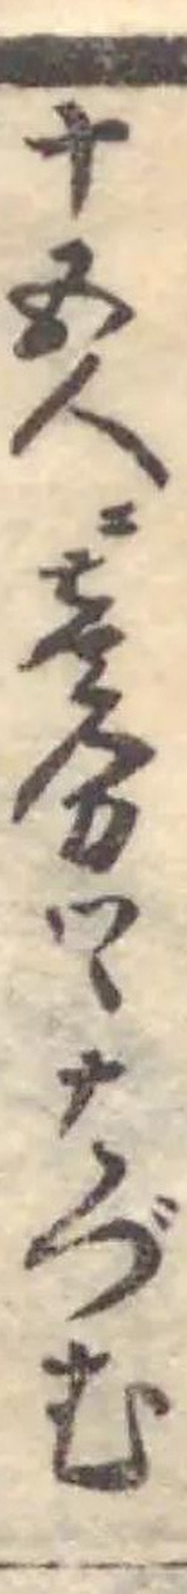十五人に壱分つゝはづむ
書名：大通人好記
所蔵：国立国会図書館 National Diet Library, JAPAN
